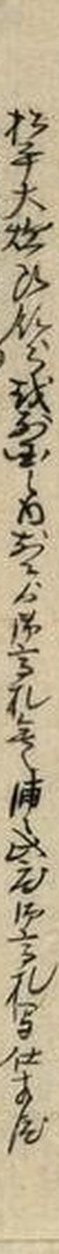松平大炊頭領分越前国之内前々ゟ御高札無之浦々此度御高札写仕相渡
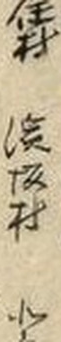浜住村
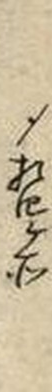〆拾四ケ所

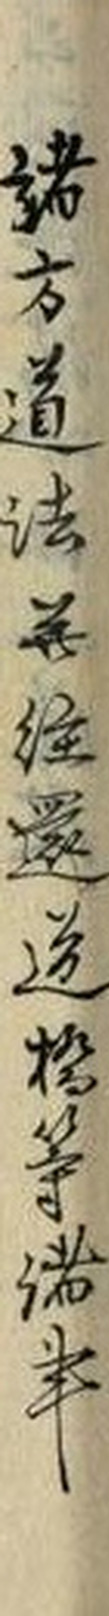諸方道法幷往還道橋等諸事
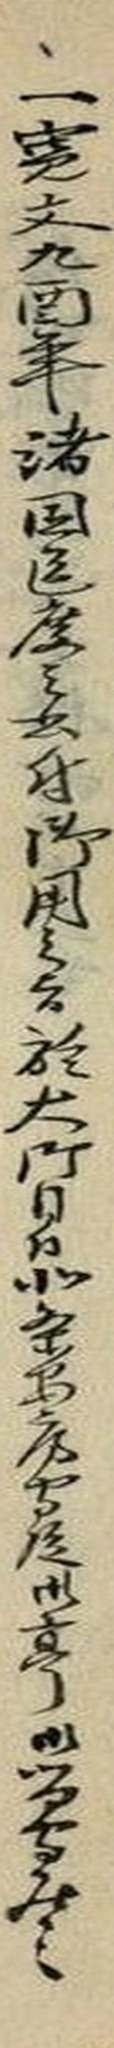一寛文九酉年諸国道度之書付御用之旨於大御目付北条安房守殿御亭御留守居之
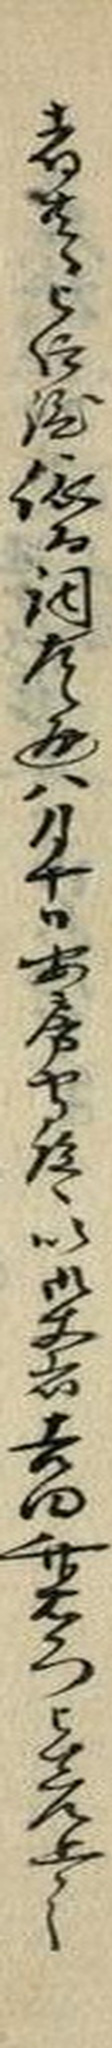者共へ被仰渡依而調左之通八月十日安房守殿へ以御使者吉田竹右衛門被差上之
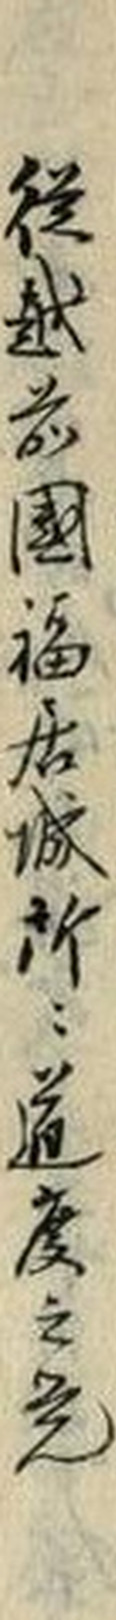従越前国福居城所々道度之覚
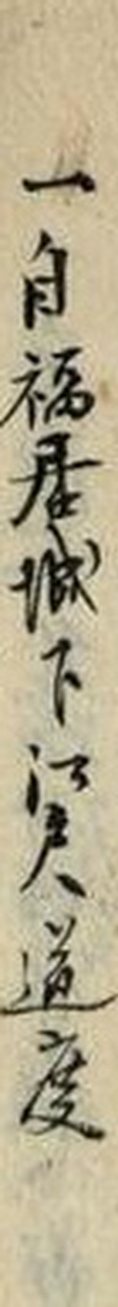一自福居城下江戸へ道度
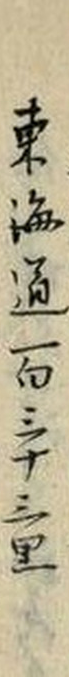東海道百三十三里
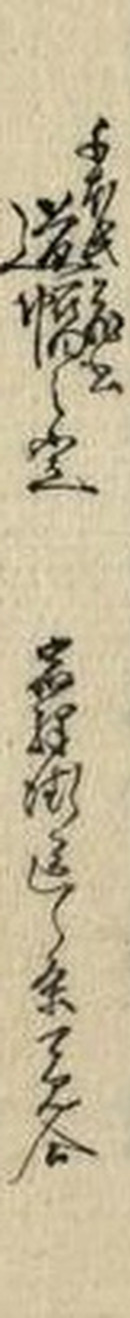道幅之定宿駅街道之条可見合
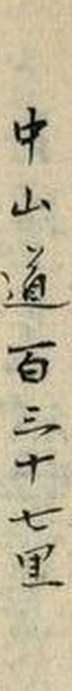中山道百三十七里
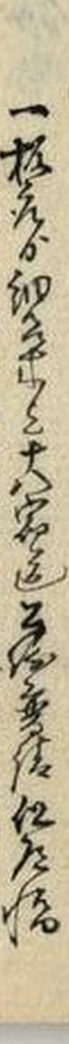一板取ゟ細呂木迄十八宿道公儀普請但道幅
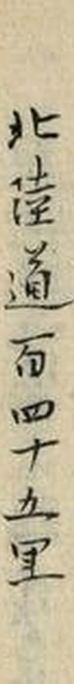北陸道百四十五里
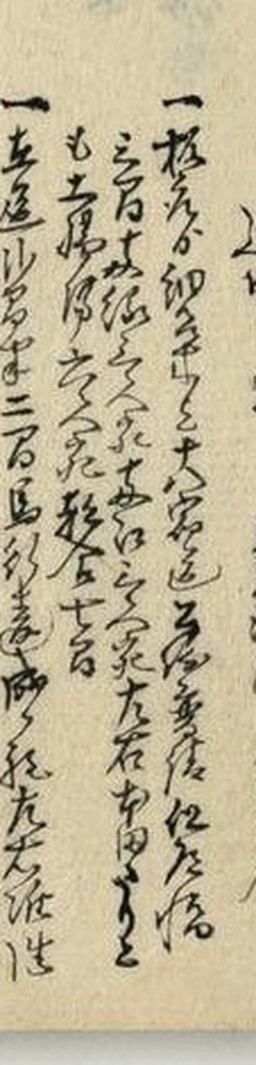三間両縁三尺宛両江三尺宛左右本田たりと
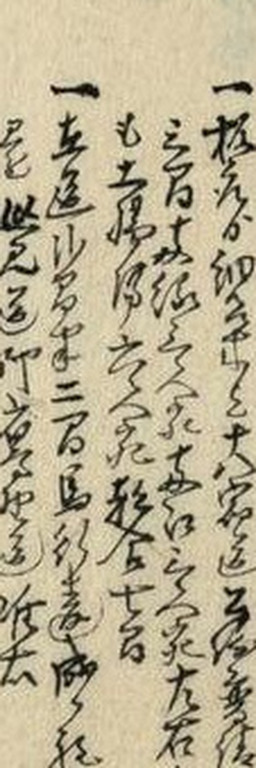も土揚場六尺宛都合七間
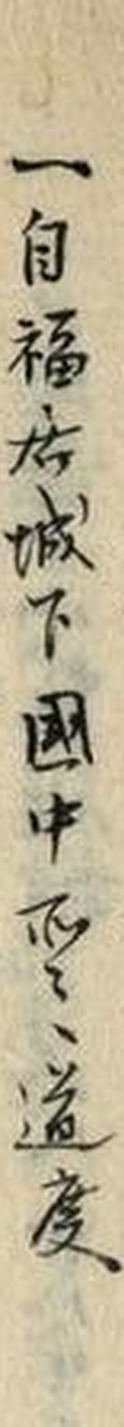一自福居城下国中所々へ道度
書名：御国他国諸事之部
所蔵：福井県文書館 Fukui Prefectural Archives
